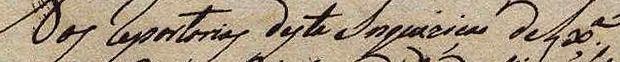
Nos Reportorios desta Inquiziçao de Lx.a
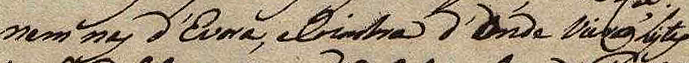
nem nos d'Evora, e Coimbra d'onde vieraõ Listas
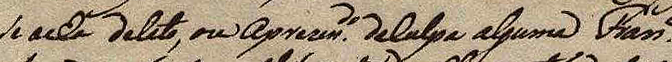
se acha delato, ou aprezen.do de culpa alguma Fran.co
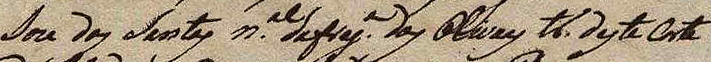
Ioze dos Santos n.al da freg.a dos Olivaes tr.o desta Corte
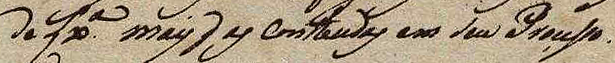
de Lx.a mais q̄ as contheudas em seu Proçesso.
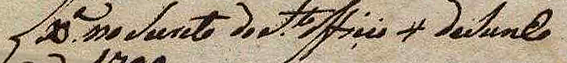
Lx.a no Secreto do S.to offiçio 4 de Iunho
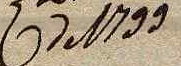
de 1799
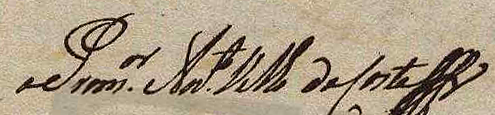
o Prom.or Ant.o Velho da Costa
